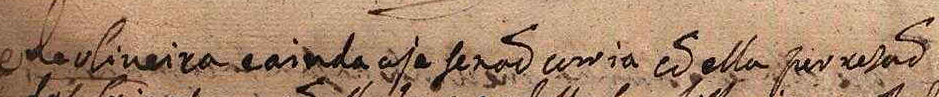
de oliueira e ainda aja se naõ corria cō ella per rezaõ
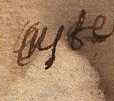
custe
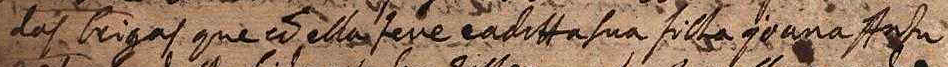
das brigas que cō ella teue e a ditta sua filha joana Antu
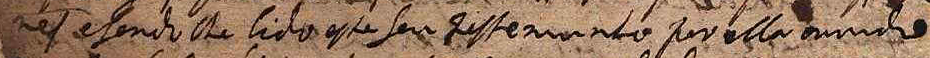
nes e sendolhe lido este seu testemunho por ella ouuido
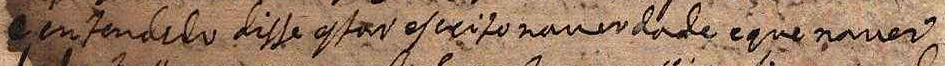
e entendido disse estar escrito na uerdade e que na uer
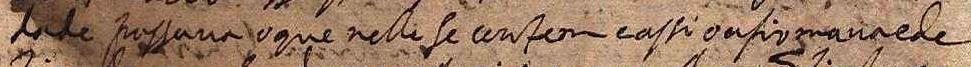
dade passaua o que nelle se contem, e assi o afirmaua e de
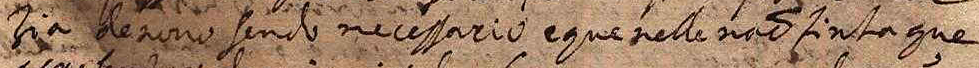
zia de nouo sendo necessario e que nelle naõ tinha que
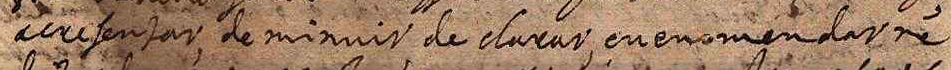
acresentar deminuir declarar, ou emmendar nē
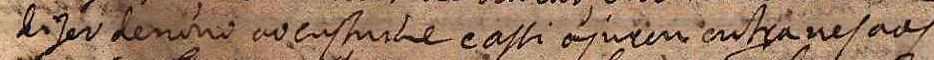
dizer de nouo ao custume e assi o jurou outra ues aos
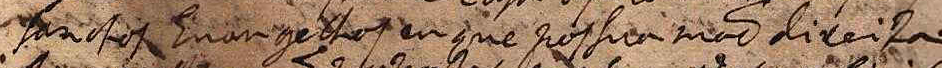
sanctos Euangelhos en que pos sua maõ direita
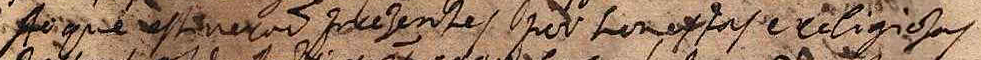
Ao que estiueraõ prezentes por honestas e religiozas
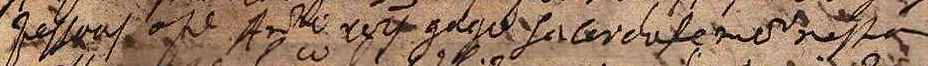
pessoas o Pe Anto reīs gago sacerdote mor nesta
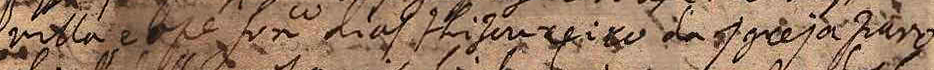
villa e o pe frnco dias thizoureiro da Jgreja paro
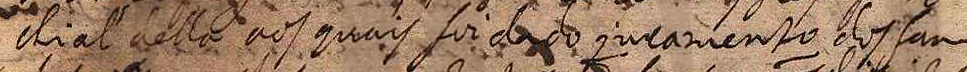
chial della aos quais foi dado juramento dos san
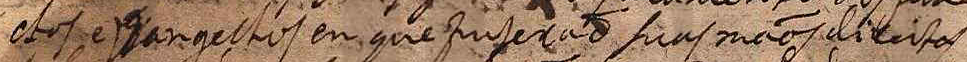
ctos evangelhos en que puseraõ suas mãos direitas
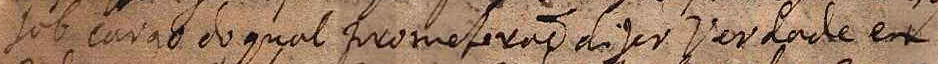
sob cargo do qual prometeraõ dizer Verdade en
